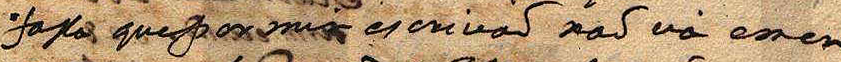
fassa que por mim escrivaõ naõ uá emen
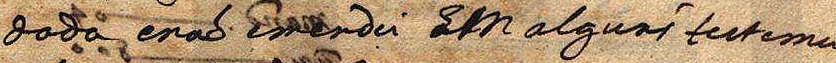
dada e naõ emendei Em alguns testemu
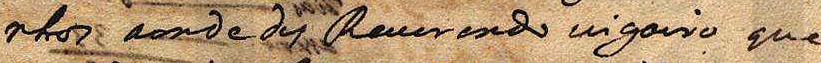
nhos aonde dis Reuerendo uigairo que
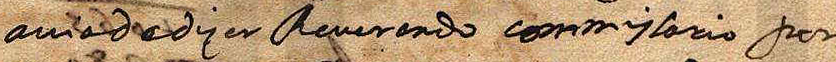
auia de dizer Reuerendo commissario por
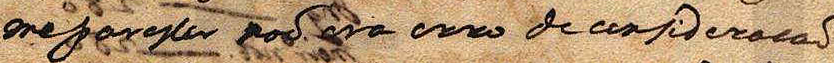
me paresser naõ era erro de consideraçaõ
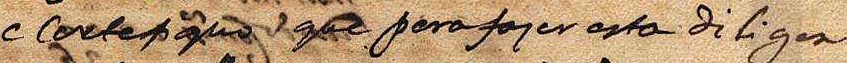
e certefiquo, que pera fazer esta diligen
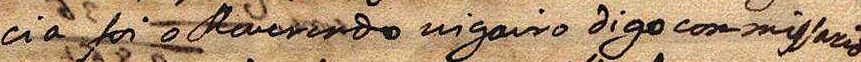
cia foi o Reuerendo uigairo digo commissario
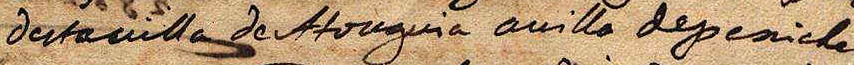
desta uilla de Atouguia a uilla de peniche
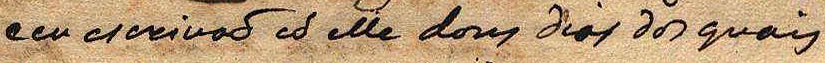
e eu escriuão cō elle dous dias dos quais
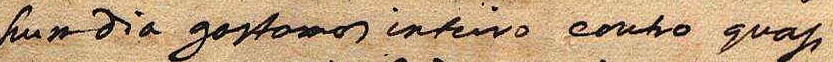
hum dia gastamos inteiro, e outro quasi
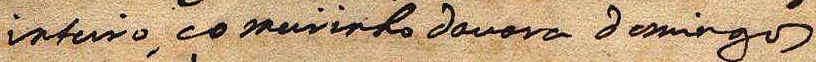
inteiro, e o meirinho da uara domingos
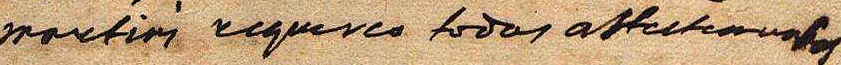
martins requereo todas as testemunhas
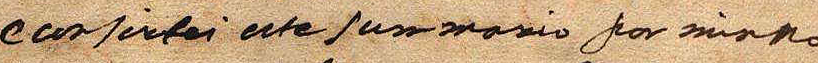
e consertei este summario por min no
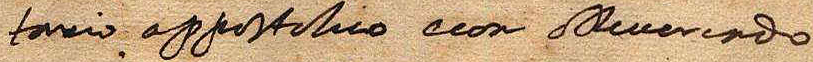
tario appostolico e com o Reuerendo
